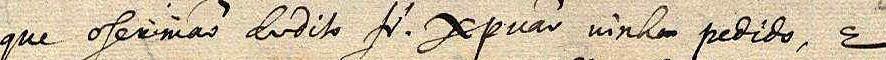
que o sermaõ do dito fr. Xpuaõ uinha pedido, E
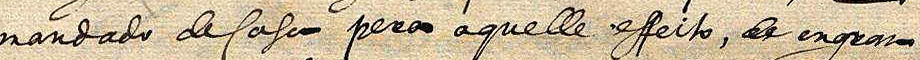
mandado de Casa pera aquelle effeito, de engran
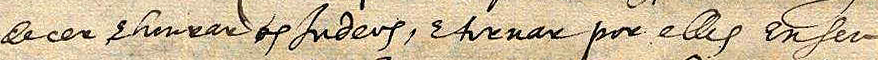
decer, E honrar os Judeos, E tornar por elles En seu
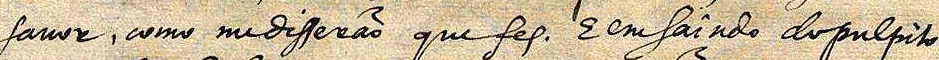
fauor, como me disseraõ que fes. E em saindo do pulpito
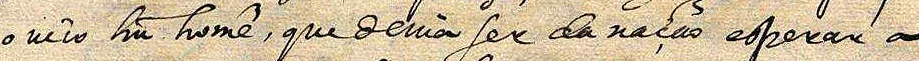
o ueio hū homē, que deuia ser da naçaõ esperar a
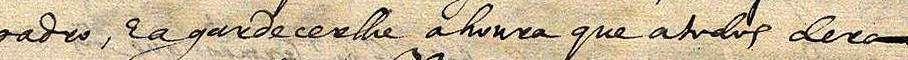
o adro, E agardecerlhe a honra que a todos dera
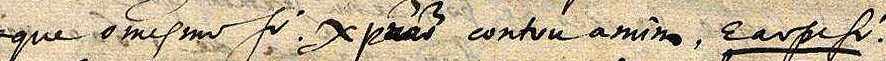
o que o mesmo fr. Xpuãõ contou a mim, E ao pe fr.
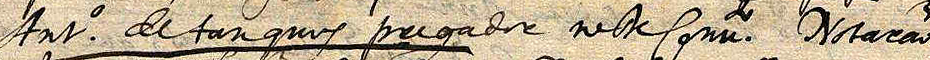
Anto. de tanquos pregador neste Conuto. Notaraõ
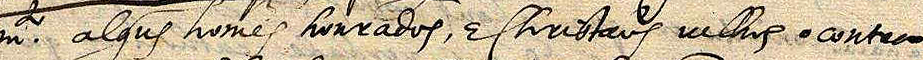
mto. algūs homes honrados, E Christaõs uelhos o contra
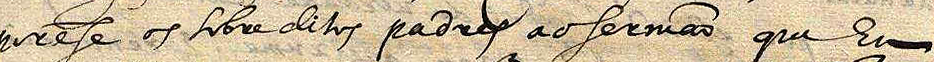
porēse os sobreditos padres ao sermão que Eu
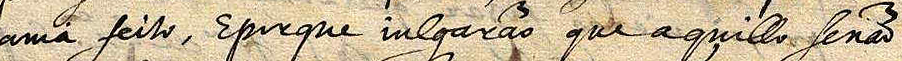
auia feito, E porque iulgarão que aquillo se não
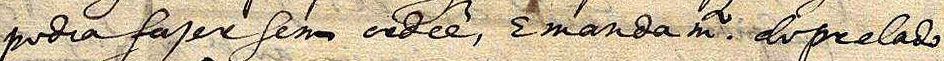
podia fazer sem ordeē, E mandamto do prelado
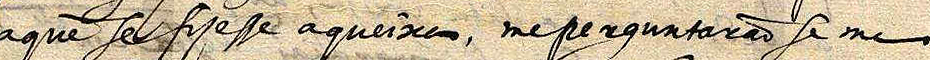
a quē se fizesse a queixa, me perguntarão se me
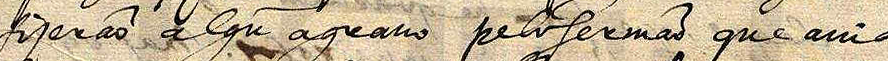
fizeraõ algū agrauo pelo sermaõ que auia
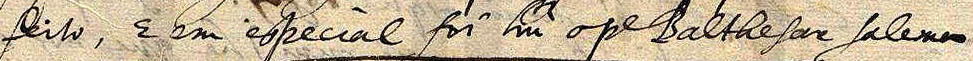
feito, E em especial foi hū o pe Balthesar salema
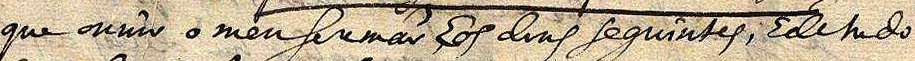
que ouuio o meu sermaõ, E os dous seguintes, E de tudo
